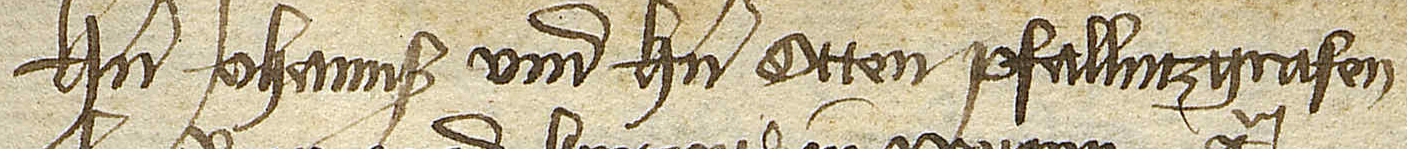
Hn* Iohannſ* vnd Hn* Otten pfallncʒgrafen
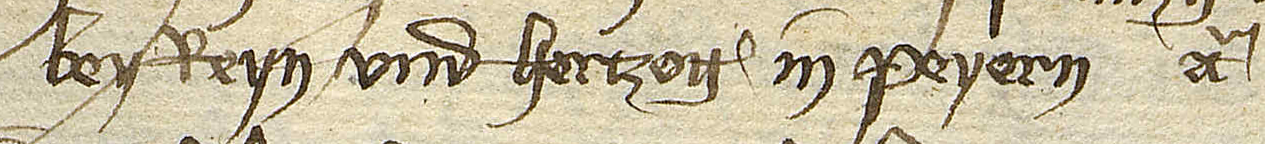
bey Reyn vnd hercʒog* in Peyern ec*
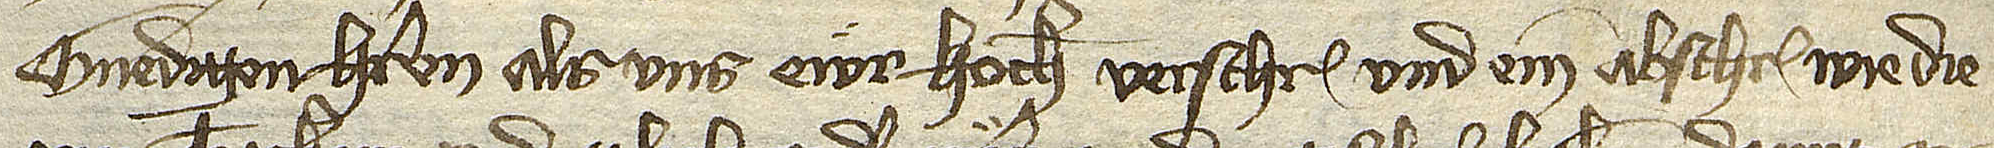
Gnedigen h*ren als vns eẅr hoch* verſchr* vnd ein abſchr* wie die
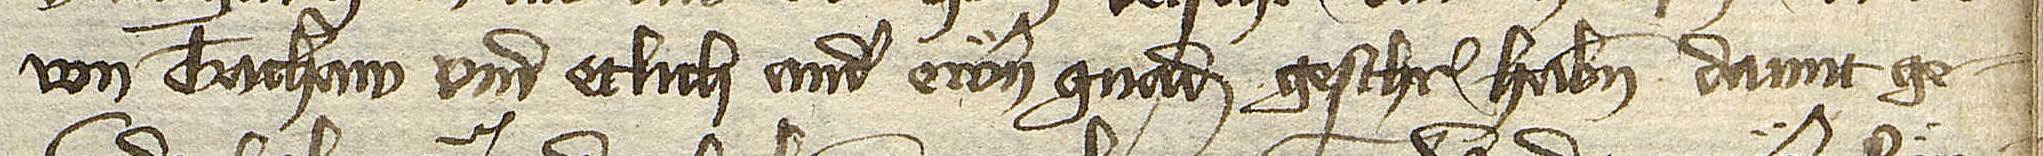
von Tachaw vnd etlich and* eẅ*n gnad* geſchr* habn* . damit ge =
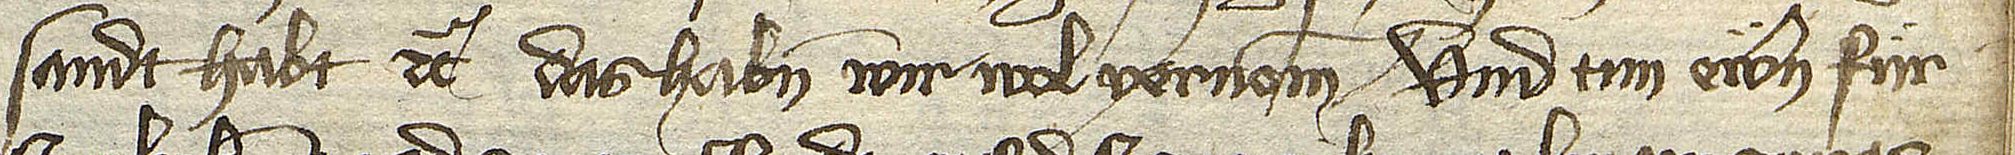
ſandt habt ec* das habn* wir wol vernom* Vnd tun eẅ*n für =
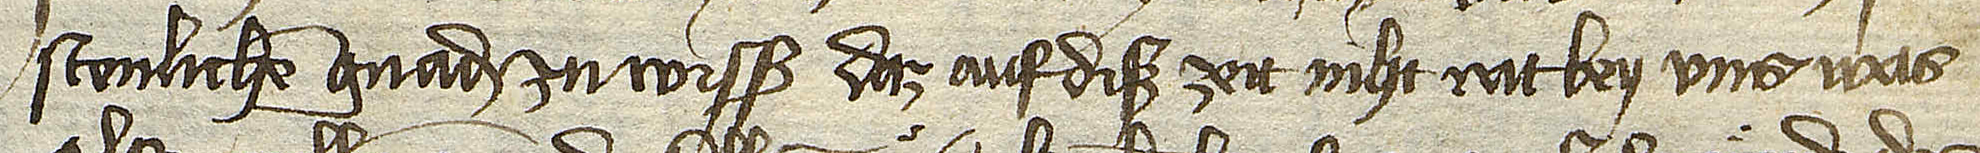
ſtenliche* gnad* ʒu wiſſ* daʒ auf diſʒ ʒeit niht rat bey vns was
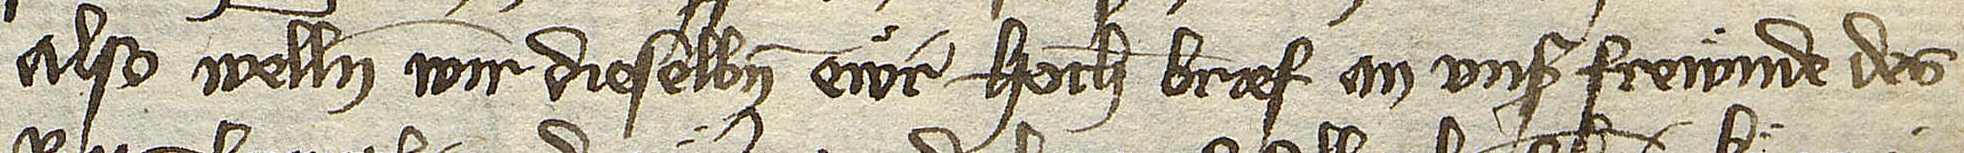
alſo welln* wir dieſelbn* eẅr* hoch* brief an vnſ* freẅnde des
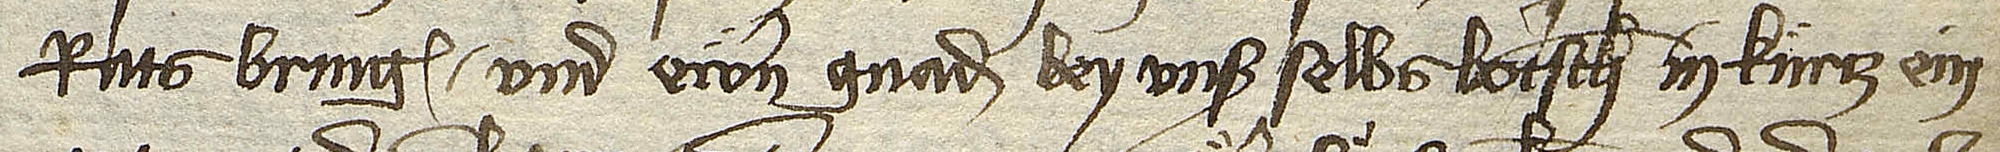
Rats bring* / vnd eẅ*n gnad* bey vnſ* ſelbs botſch* in kürcʒ ein
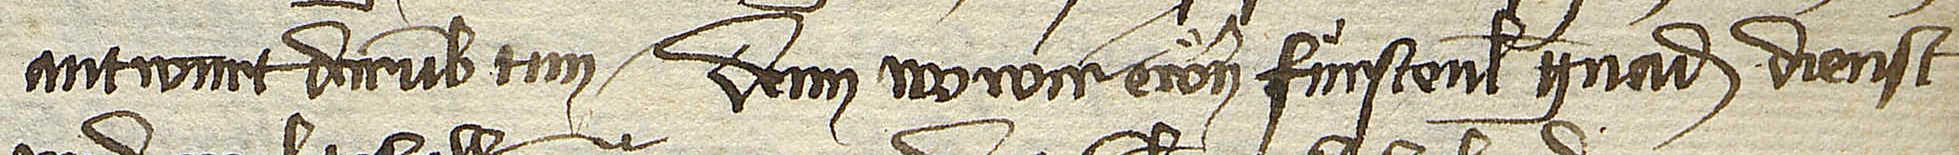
antwurt darub* tun / Denn wo wir eẅ*n fürſtenl* gnad* dienſt
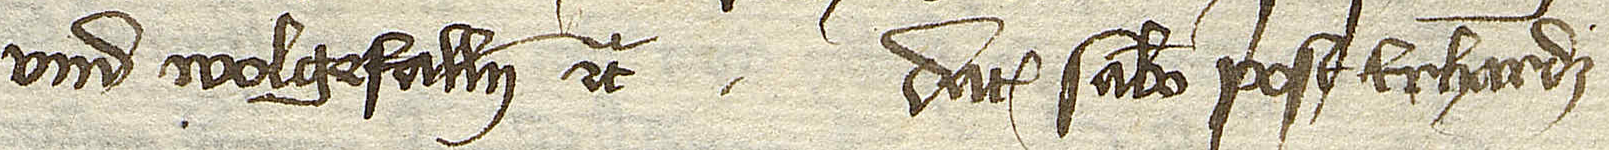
vnd wolgefalln* ec* / Dat* ſabo* poſt Erhardi
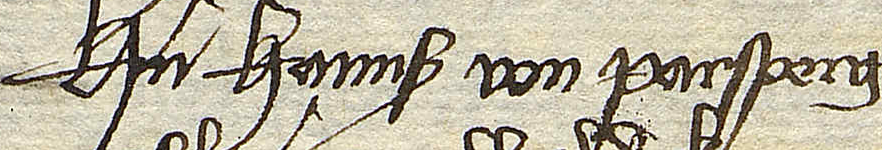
Hn* Hannſ* von Parſperg
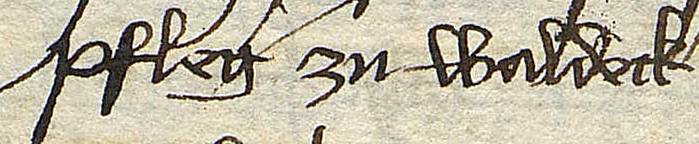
pfleg* ʒu Waldeck
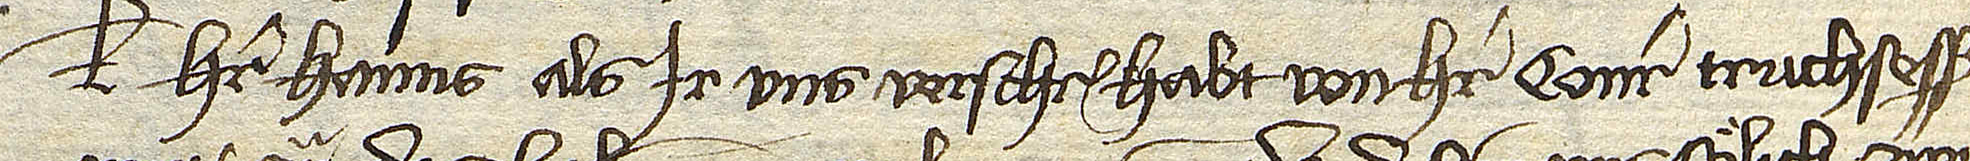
L* Hr* Hanns als Ir vns verſchr* habt von Hr* Conr* truchſeſſ*
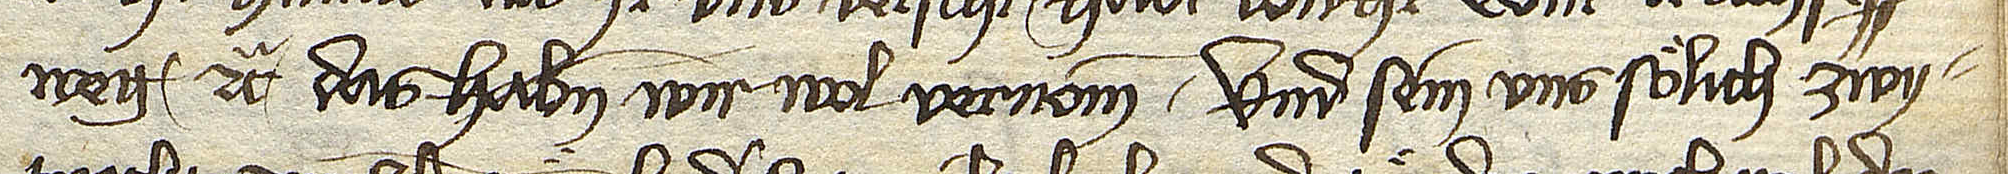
weg* ec* das habn* wir wol vernom* / Vnd ſein vns ſölich ʒwy =
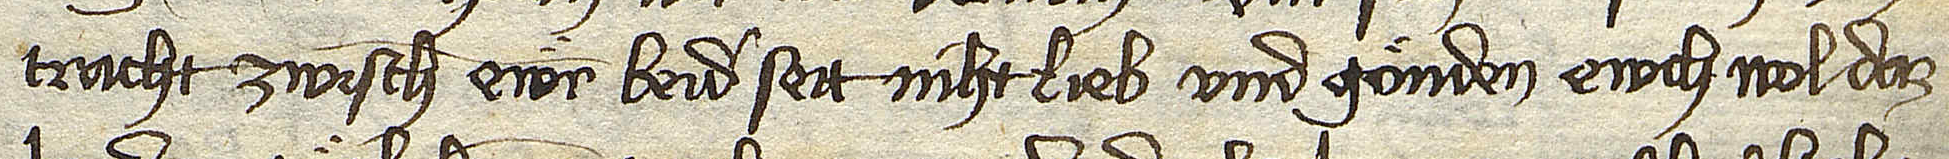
tracht ʒwiſch* eẅr beid* ſeit niht lieb vnd gönden ewch wol daʒ
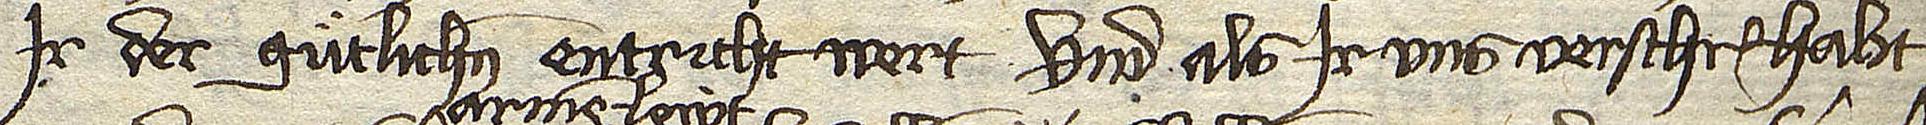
Ir der gütlichn* entricht wert . Vnd als Ir vns verſchr* habt
